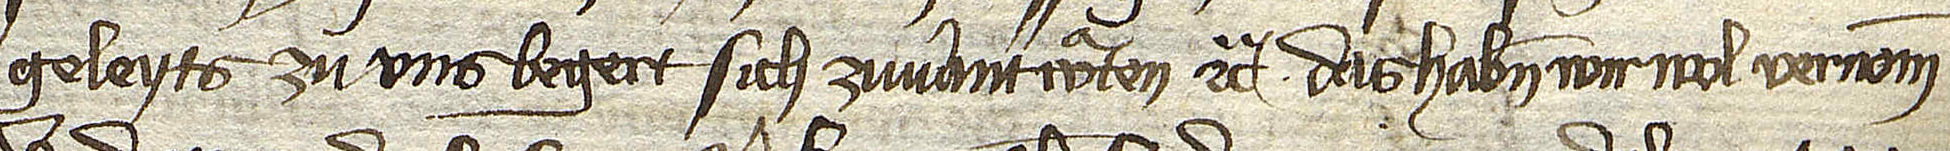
geleyts ʒu vns begert ſich ʒuu*antw*ten ec* . das habn* wir wol vernom*
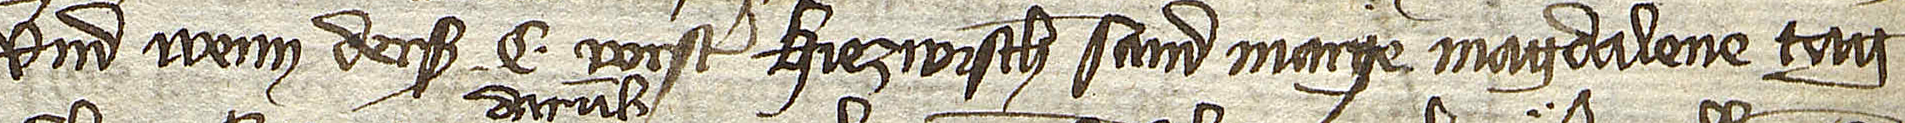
Vnd wenn derſ* . C . vorſt* Hieʒwiſch* ſand marie magdalene tag
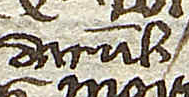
darub*
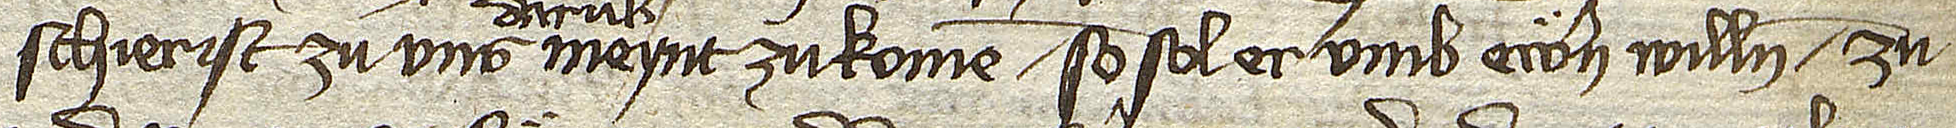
ſchieriſt ʒu vns meynt ʒukome* / ſo ſol er vmb eẅ*n willn* / ʒu
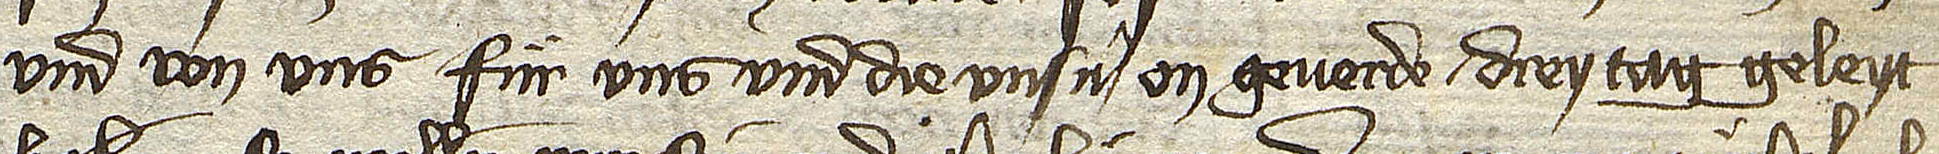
vnd von vns / für vns vnd die vnſn* on geuerde / drey tag geleyt
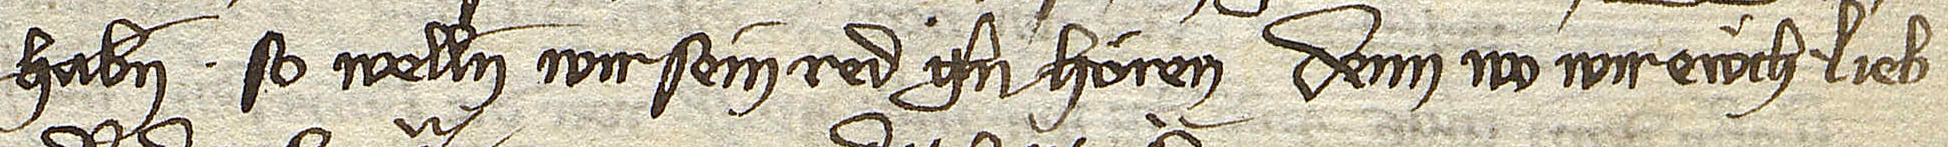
habn* . ſo welln* wir ſein red g*n hören Denn wo wir eẅch lieb
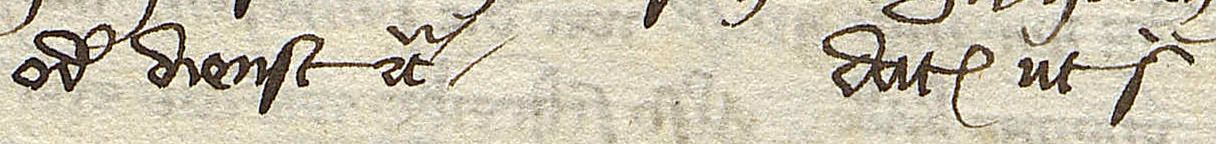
od* dienſt ec* / Dat* ut ſ*
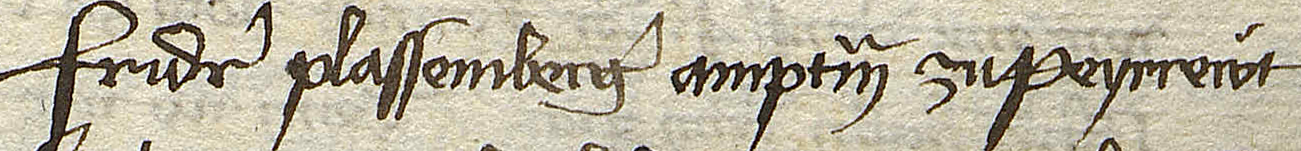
Fridr* plaſſemberg* amptm* ʒu Peyrreẅt
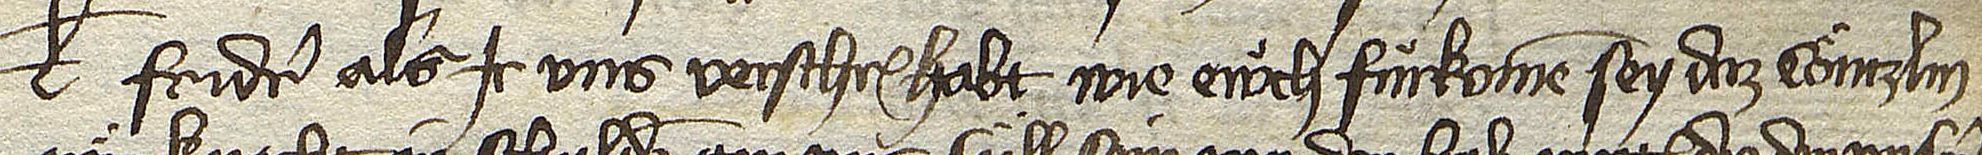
L* fridr* als Ir vns verſchr* habt wie eẅch fürkome* ſey daʒ Cöncʒlin
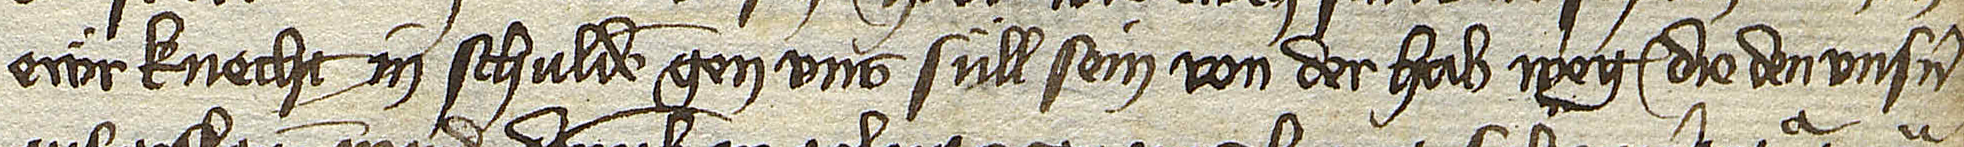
eẅr knecht in ſchulde* gen vns ſüll ſein von der hab weg* die den vnſn*
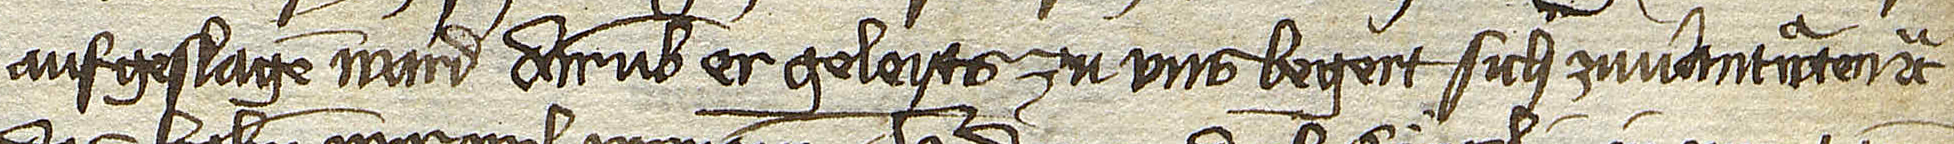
aufgeſlage* ward darub* er geleyts ʒu vns begert ſich ʒuu*antw*ten ec*
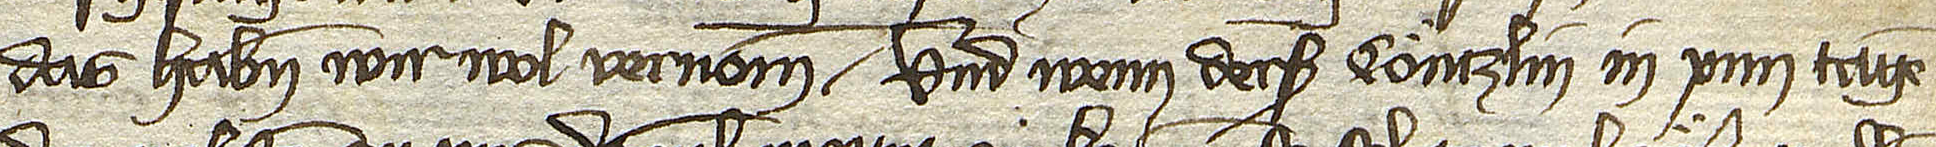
das habn* wir wol vernom* / Vnd wenn derſ* Cöncʒlin in xiiii tage*
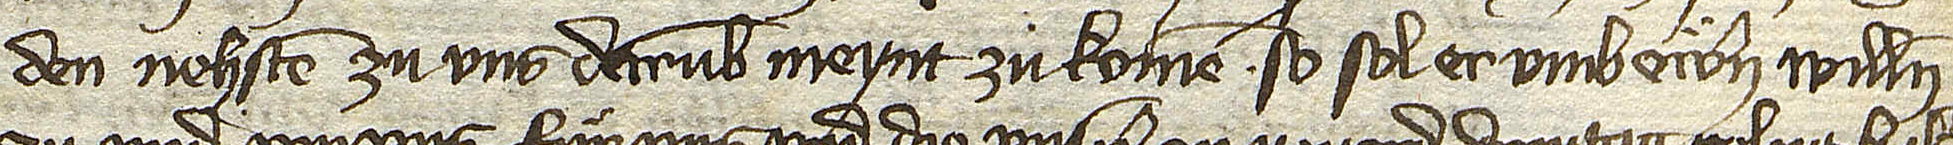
den nehſte* ʒu vns darub* meynt ʒu kome* . ſo ſol er vmb eẅ*n willn*
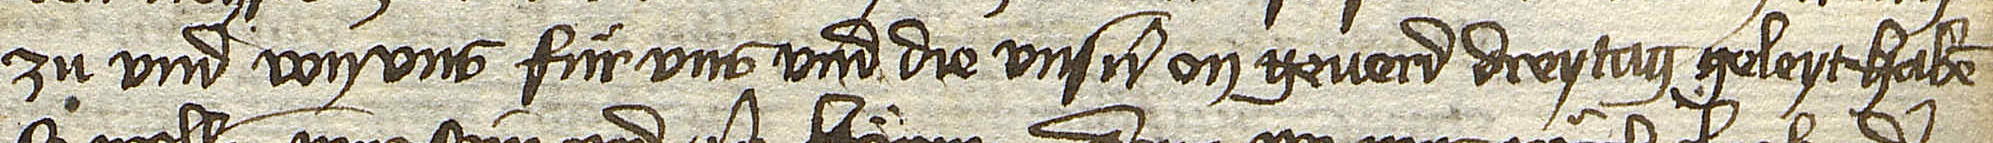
ʒu vns von vns für vns vnd die vnſn* on geuerd dreytag geleyt habe*
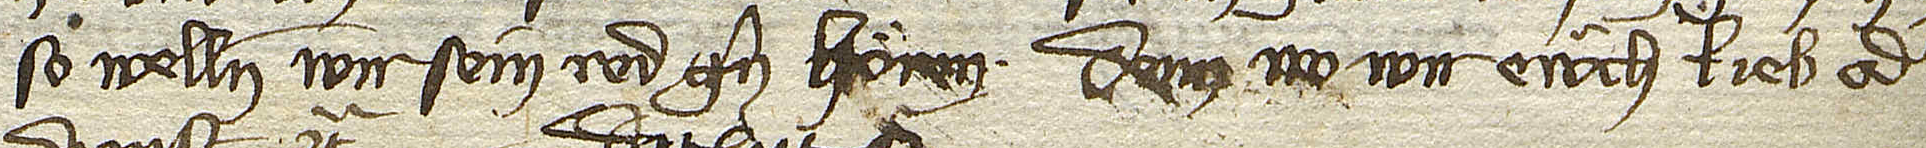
ſo welln* wir ſein red g*n hören . Denn wo wir eẅch lieb od*
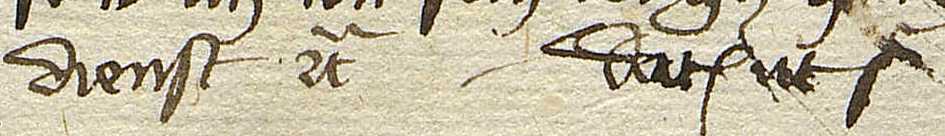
dienſt ec* / Dat* ut ſ*
